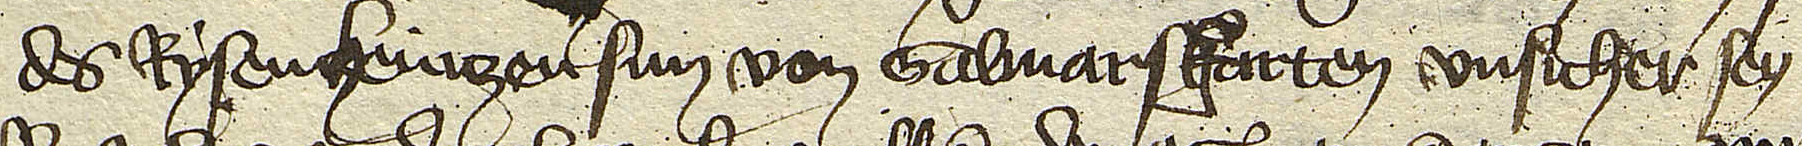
des Ryſenheincʒen ſun von Galmarſgarten vnſicher ſey
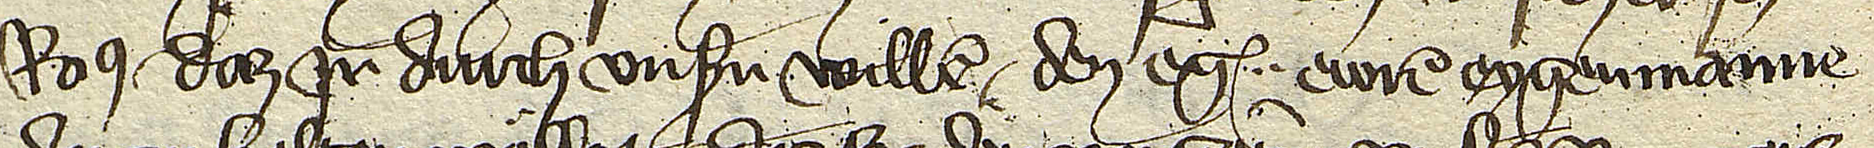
Ro* / daʒ Ir durch vnſ*n wille* / den eg* ~ ewre* eygenmanne
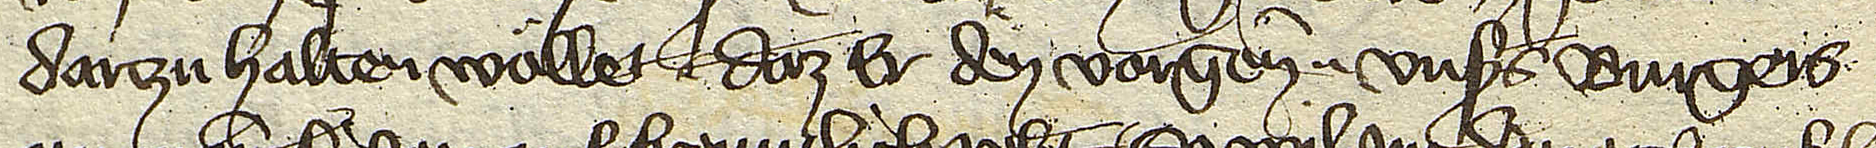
darcʒu halten wöllet / daʒ Er den vorgen* ~ vnſ*s Burgers
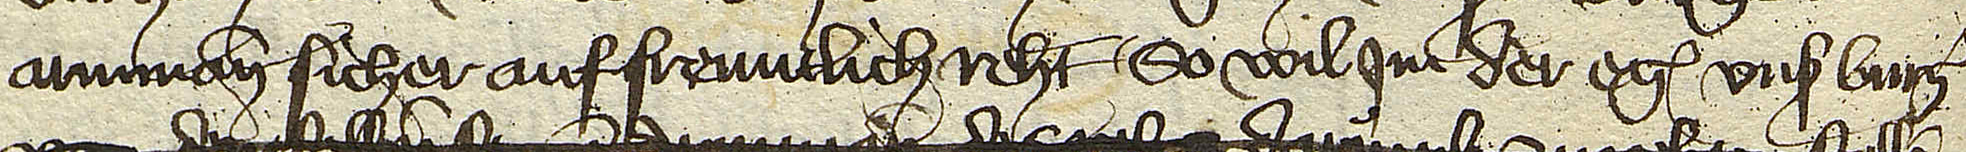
armman* ſicher auf freuntlich reht / So wil Im der eg* vnſ* burg*
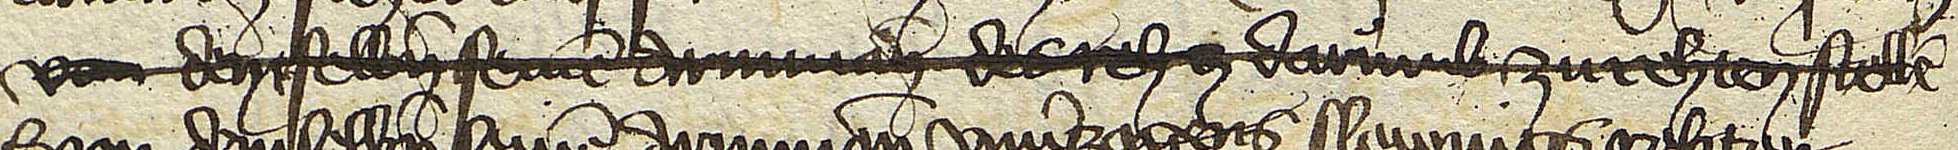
von demſelbn* ſeine* Armman* des reh cʒ darümb cʒu rehten ſtelle*
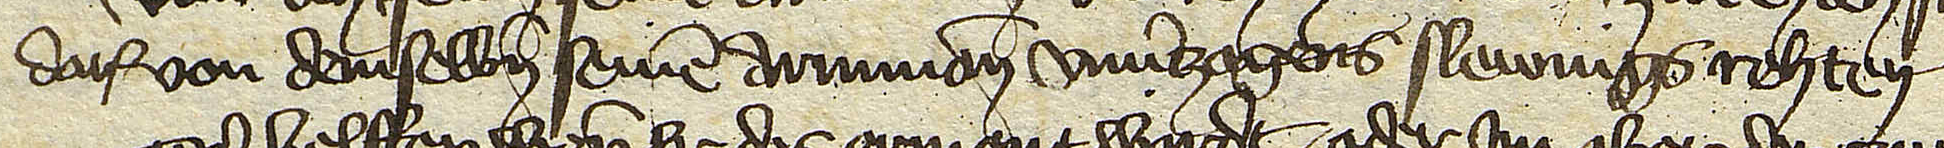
dar* von demſelbn* ſeine* Armman* vnu*cʒogens ſlewnigs rehten
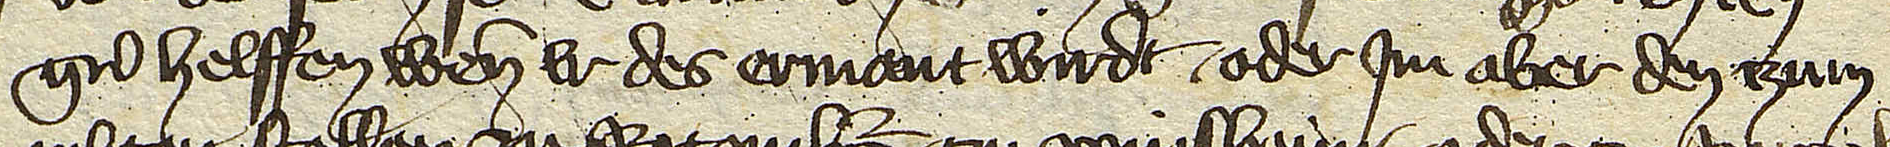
gn* helffen wen* Er des ermant wirdt / oder Im aber den cʒum
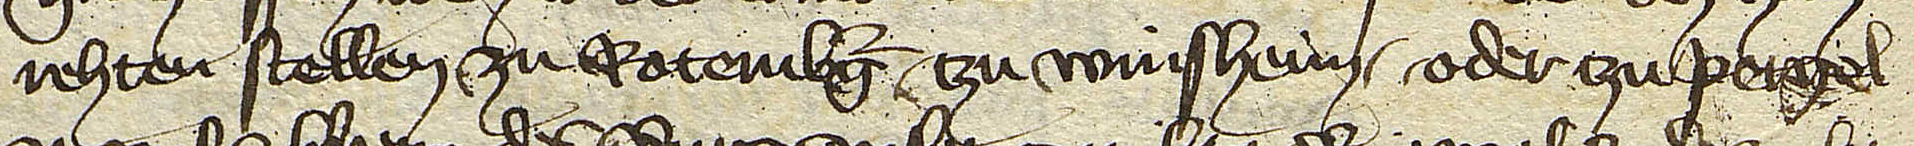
rehten ſtellen cʒu Rotemb*g / cʒu winſheim / oder cʒu pergel
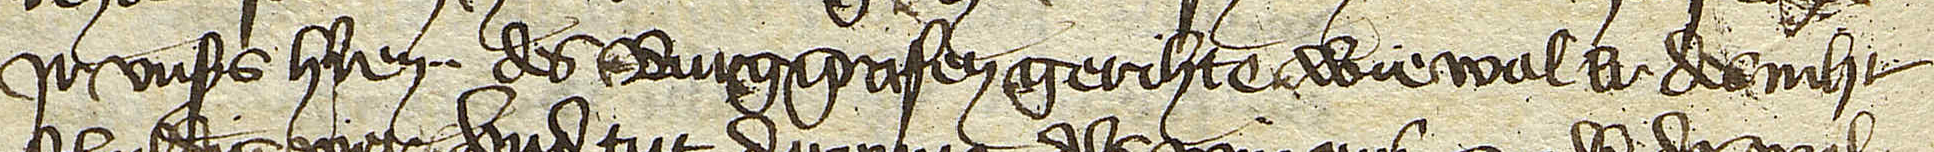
Ir vnſ*s h*ren ~ des Burggrafen gerihte / wie wol Er des niht
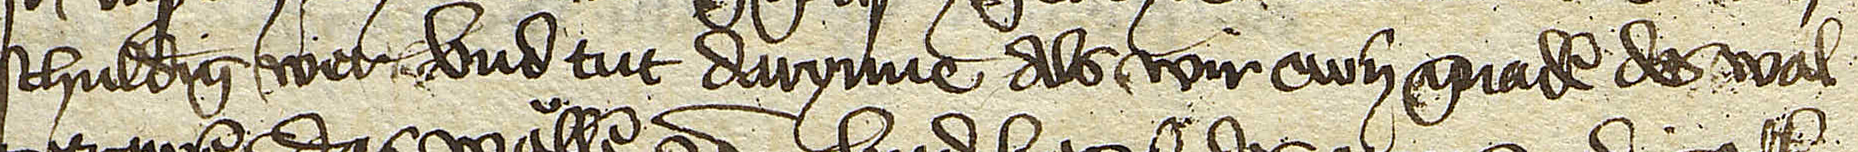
ſchuldig wer / vnd tut darynne Als wir ew*n gnad* des wol
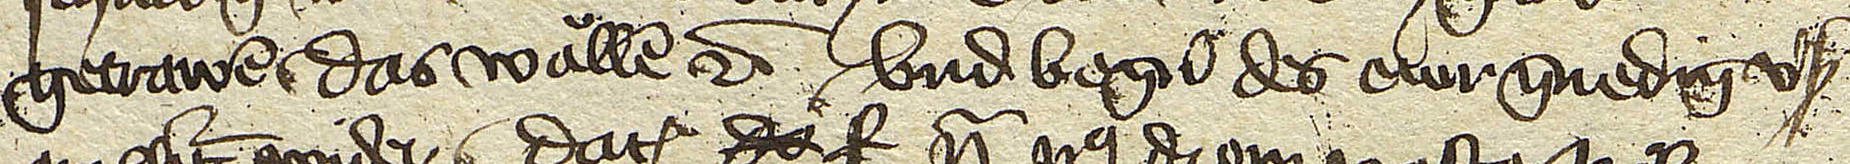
getrawe* / das wölle* ec* / vnd begn des ewr gnedig v*ſ*
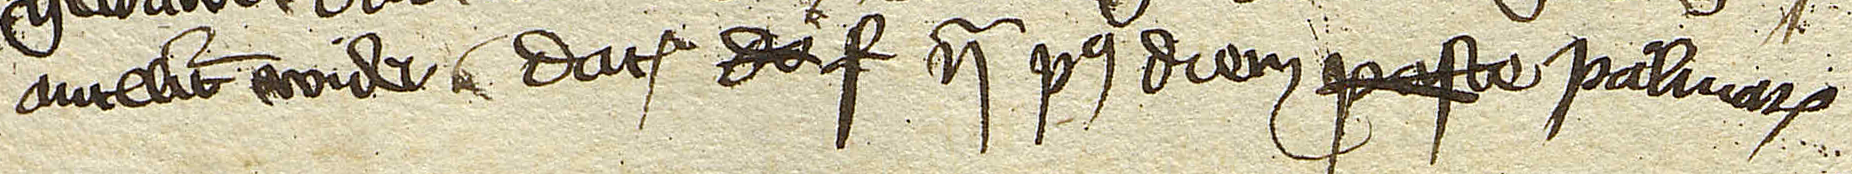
antw*t wider / dat* do f ii* p* diem paſce palma*
